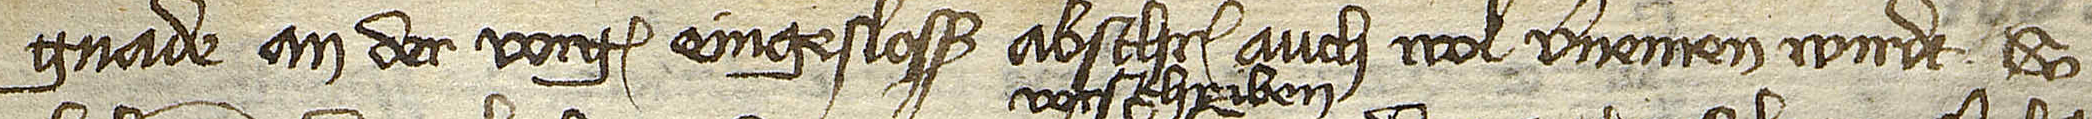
gnade an der vorg* eingeſloſſ* abſchr* auch wol v*nemen wirdt . So
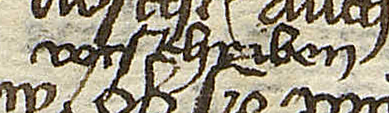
vorſchriben
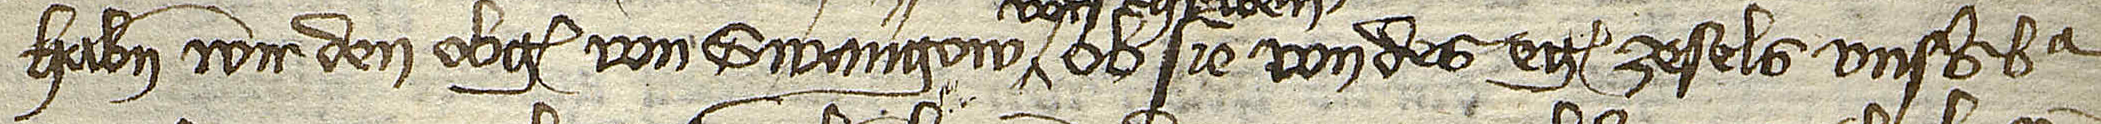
habn* wir den obg* von Swangow ob ſie von des eg* ʒefels vnſ*s b*
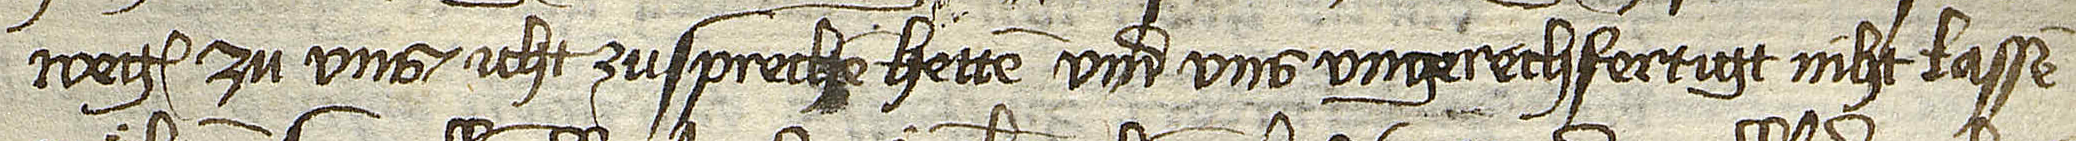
weg* ʒu vns / icht ʒuſpreche* hette* vnd vns vngerechfertigt niht laſſe*
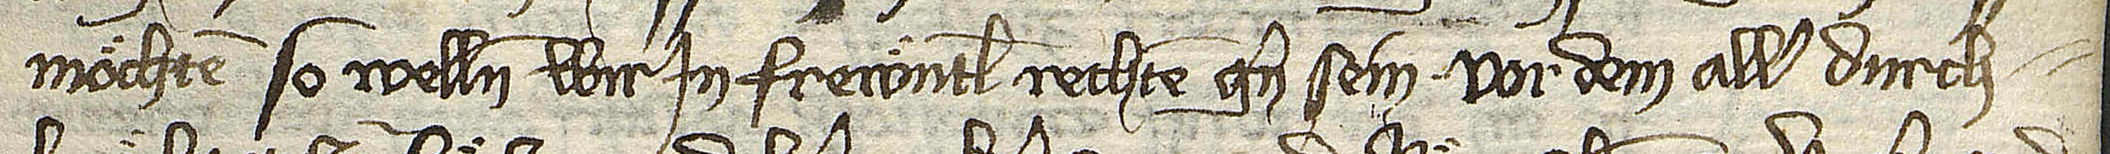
möchte* ſo welln* Wir In freẅntl* rechte* g*n ſein vor dem all* durch =
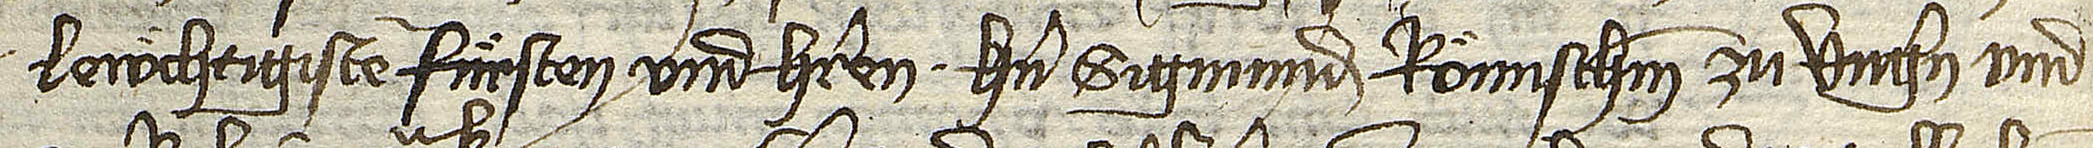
leẅchtigiſte* fürſten vnd h*ren . hn* Sigmund* Römiſchm* ʒu Vng*n vnd
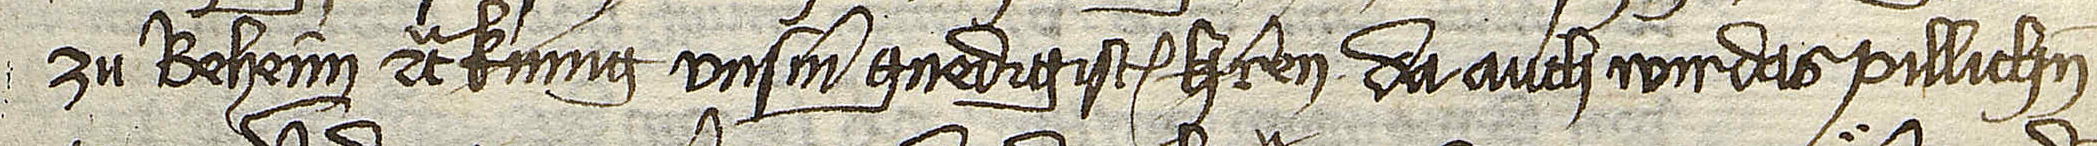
ʒu Beheim ec* kunig vnſm* gnedigiſt* h*ren . Da auch wir das pillichn*
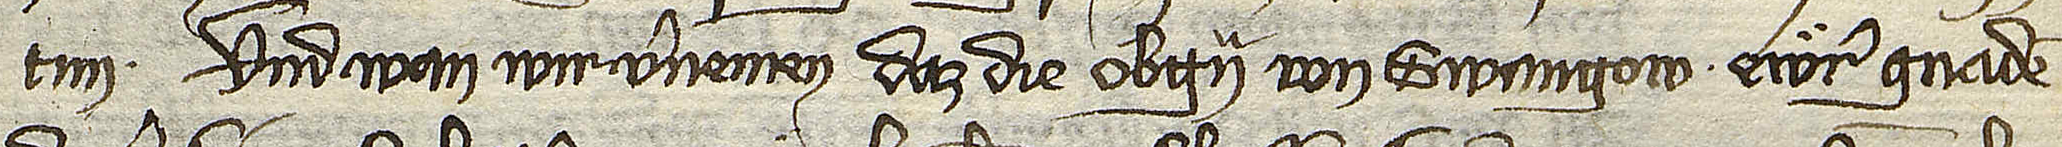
tun . Vnd wan wir v*nemen daʒ die obgn* von Swangow . eẅr* gnade*
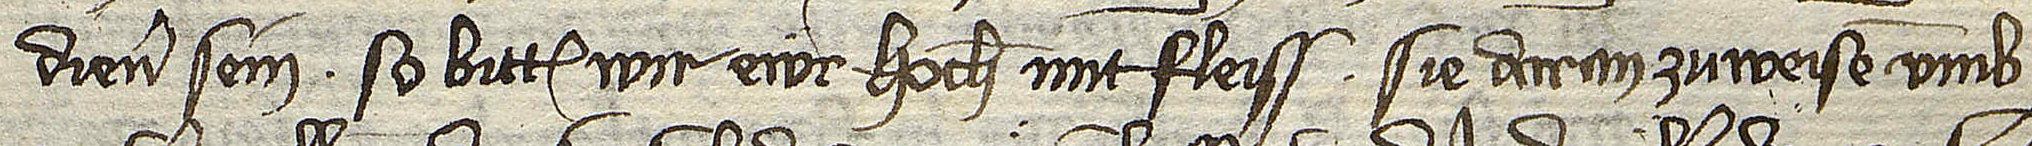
dien* ſein . ſo bitt* wir eẅr hoch* mit fleiſſ . ſie daran ʒuweiſe* vmb
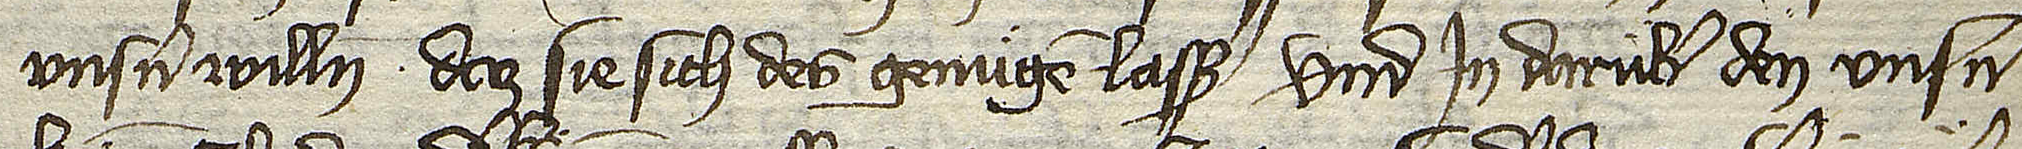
vnſn* willn* . daʒ ſie ſich des genüge* laſſ* Vnd In darüb* den vnſn*
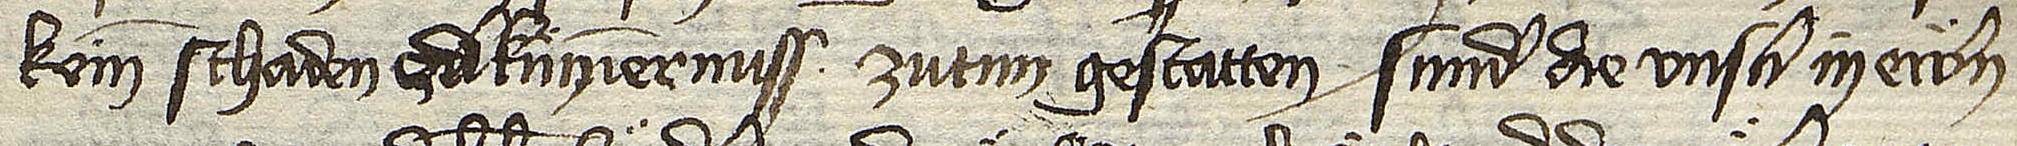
kein* ſchaden od* küm*ernuſſ . ʒutun geſtatten ſund* die vnſn* in eẅ*n
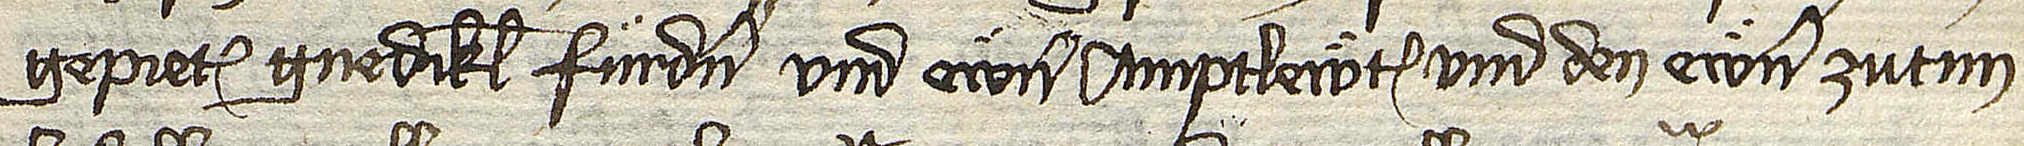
gepiet* gnedikl* fürdn* vnd eẅ*n Amptleẅt* vnd den eẅ*n ʒutun
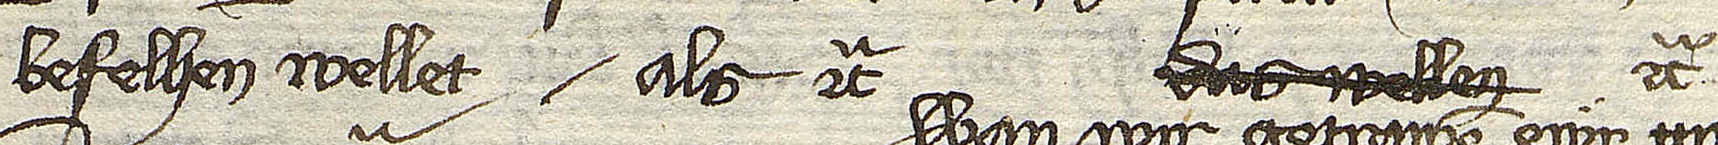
befelhen wellet / als ec* das wellen ec*
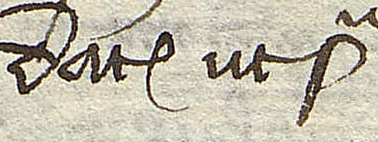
Dat* ut ſ*
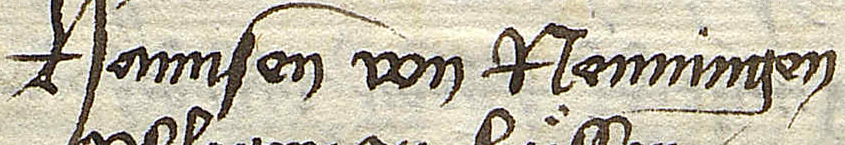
Hannſen von Nenningen
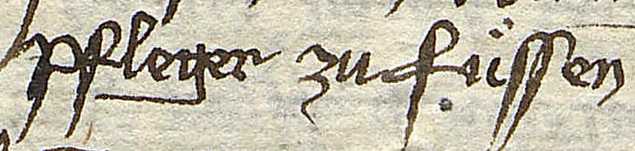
pfleger ʒu füſſen
